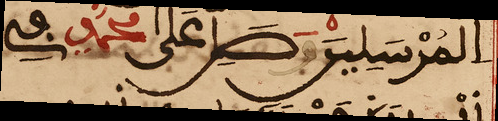المرسلين وصل على محمد في
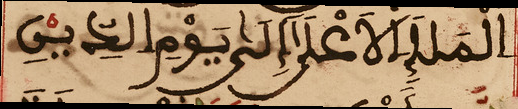الملإ الاعلى إلى يوم الدين
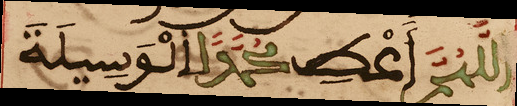اللهم أعط محمدا الوسيلة
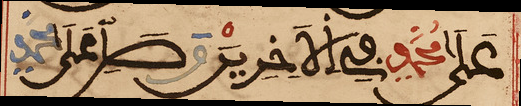على محمد في الاخرين وصل على محمد
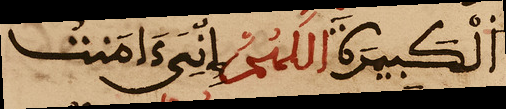الكبيرة اللهم إني ءامنت
